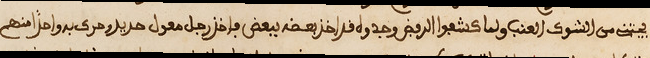يجتنى من الشوك العنب ولما كشفوا الرفض وجدوه قد اخذ بعضه ببعض فاخذ رجل معول حديد وحرك به واحداً منهم
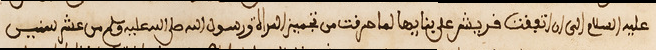عليه السلام الى ان اتفقت قريش على بنايها لما حرفت من تجميز المراة ورسول الله صلى الله عليه وسلم من عشر سنين
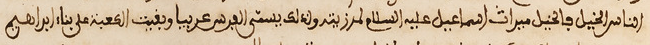الناس الخيل فالخيل ميراث اسماعيل عليه السلام لمرذيته ولذلك يسمّى الفرس عريبا بغيت الكعبة على بناء ابراهيم
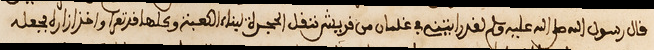قال رسول الله صلى الله عليه وسلم لقد رايتنى في غلمان من قريش ننقل الحجرة لبناء الكعبة وكلها قد تعرا واخذا زاده بجعله
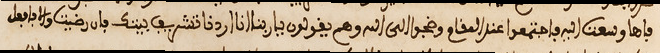فاها وسعت اليه فاجتمعوا عند المقام وضجوا الى الله وهم يقولون يا ربنا انا اردنا تشريف بيتك فان رضيت والافا فعل
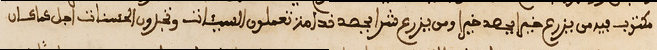مكتوب فيه من يزرع خيرا يحصد خيرا ومن يزرع شرا بجصد خدامة تعملون السيئات وتجدون الحسنات اجل كما كان
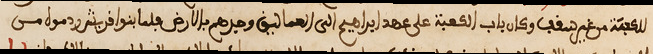للكعبة من غير سقف وكان باب الكعبة على عهد ابراهيم الى العماليق وجدهم بالارض فلما بنوا قريش ردمول من
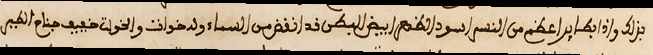بذلك واذا بطائر اعظم من النسر اسود الظهر ابيض البطن قد انقض من السماء وله خوات الخوبت خفيف جنام الطير
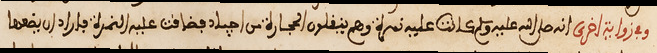وفي زواية ضرى انه صلى الله عليه وسلم كانت عليه نمرة وهم ينقلون الحجارة من اجياد فضاقت عليه النمرة فاراد ان يضعها
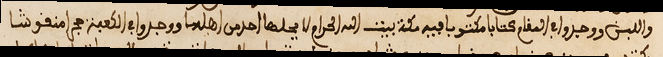واللبن ووجدوا في المقام كتابا مكتوبا فيه مكة بيت الله الحرام لا يحلها احد من اهلها ووجدوا في الكعبة حجر امنقوشا
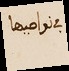في نواصيها
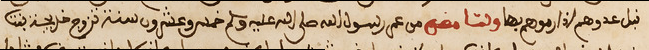نبل عدوهم اذا رموهم بها ولمّا مض# من عمر رسول الله صلى الله عليه وسلم خمس وعشرون سنة تزوج خديجة بنت
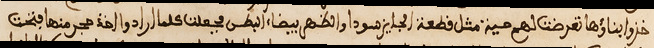خذو ابناؤها تعرضت لهم حية مثل قطعة الجايز سودا والظهر بيضاء البطن فجعلت كلما اراد والخذ حجر منها بتحت
